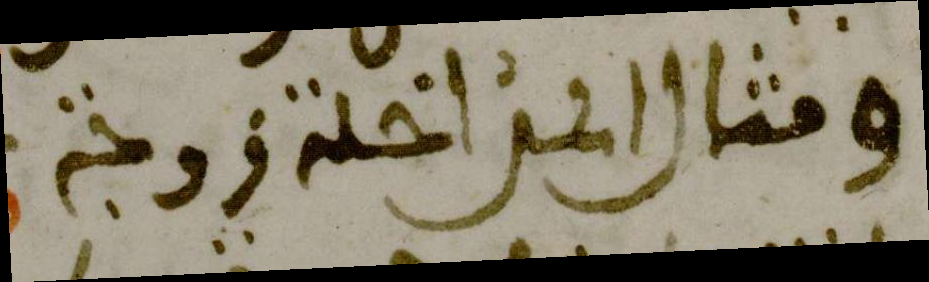ومثال المداخلة زوجة
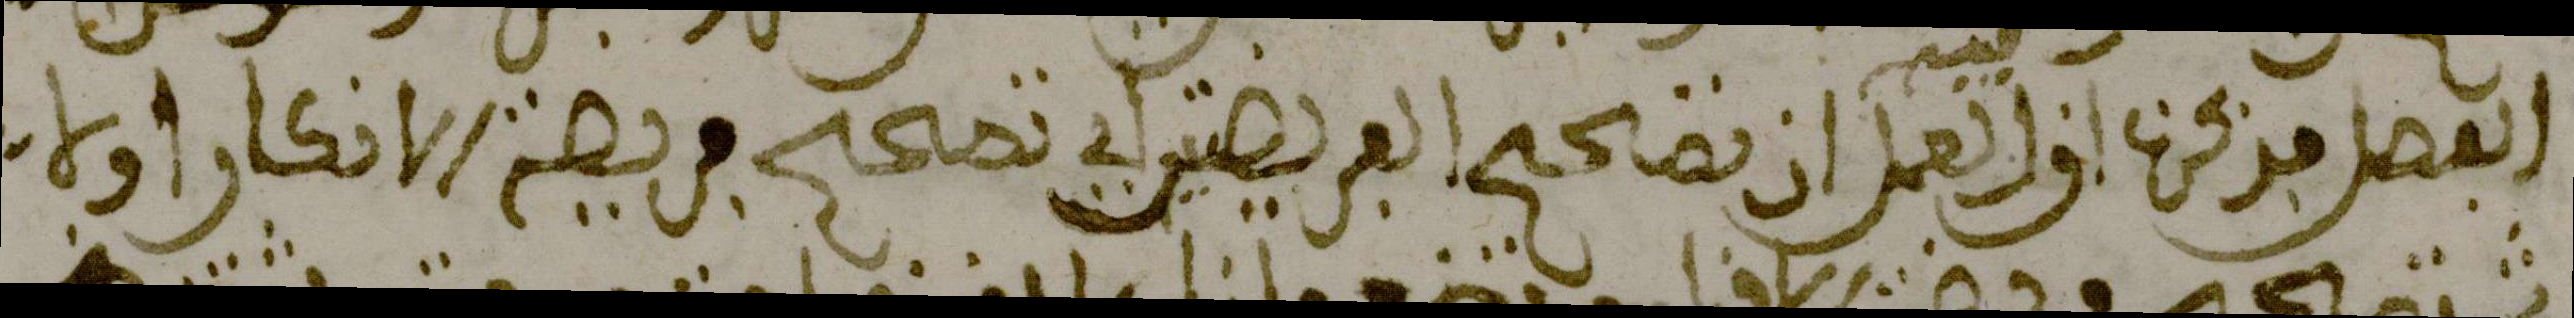الفصل فذكرن ان العمل ان تصحح الفريضة اي تصحح فريضة الانكار اولا
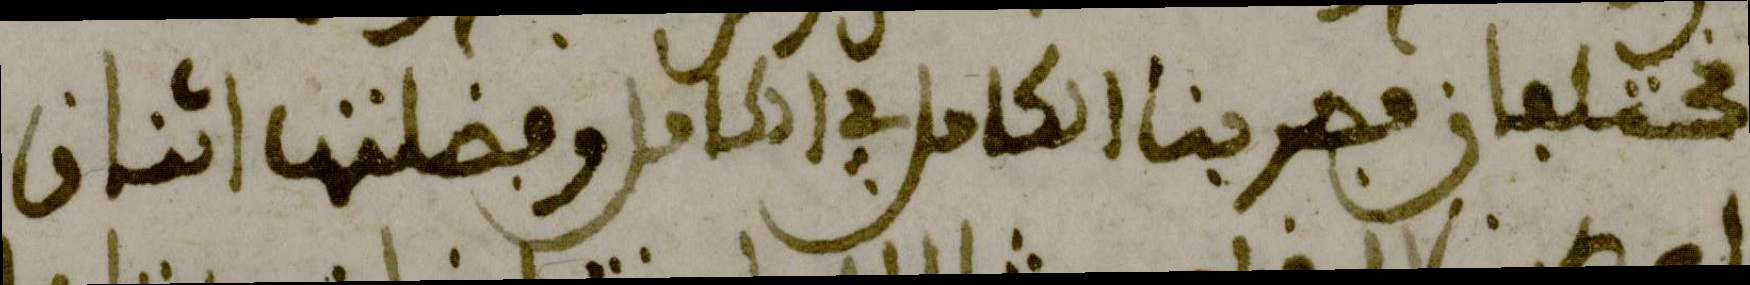مختلفان فضربنا الكامل في الكامل وفضلتها اثنان
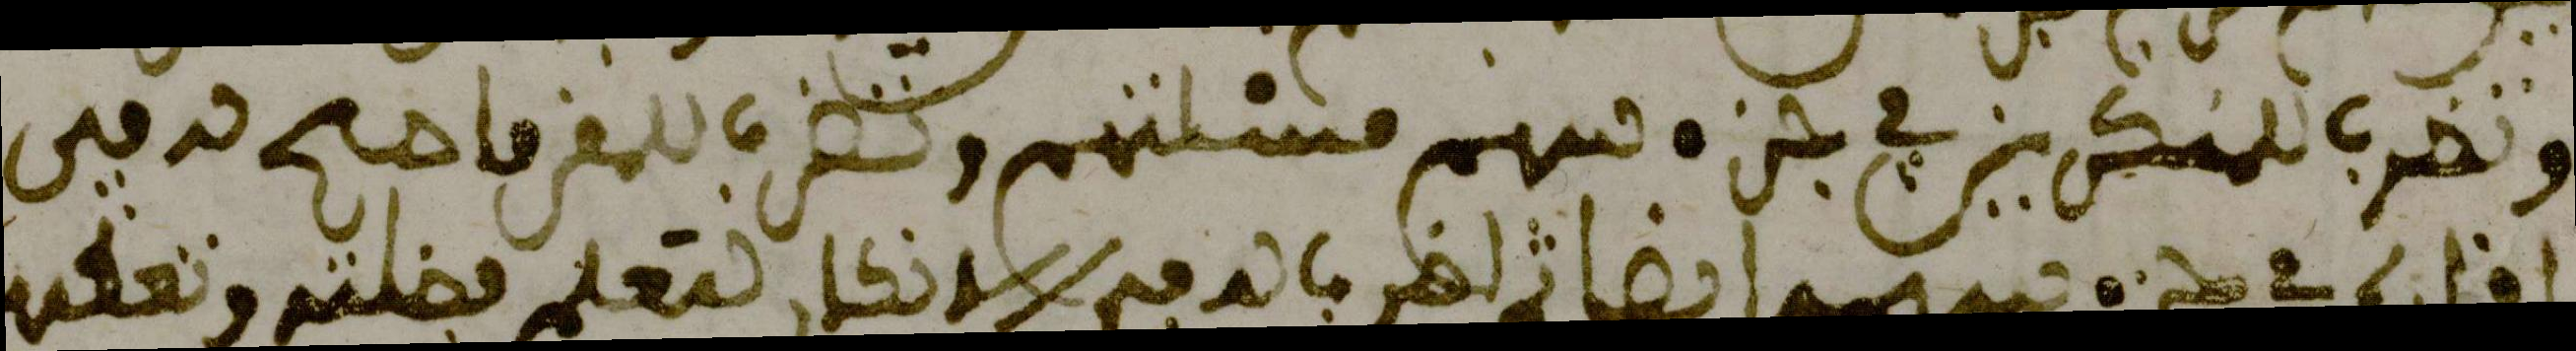وتضرب للمنكرين في جزء سهم مسئلتهم وتضرب للمقر ما صح له في
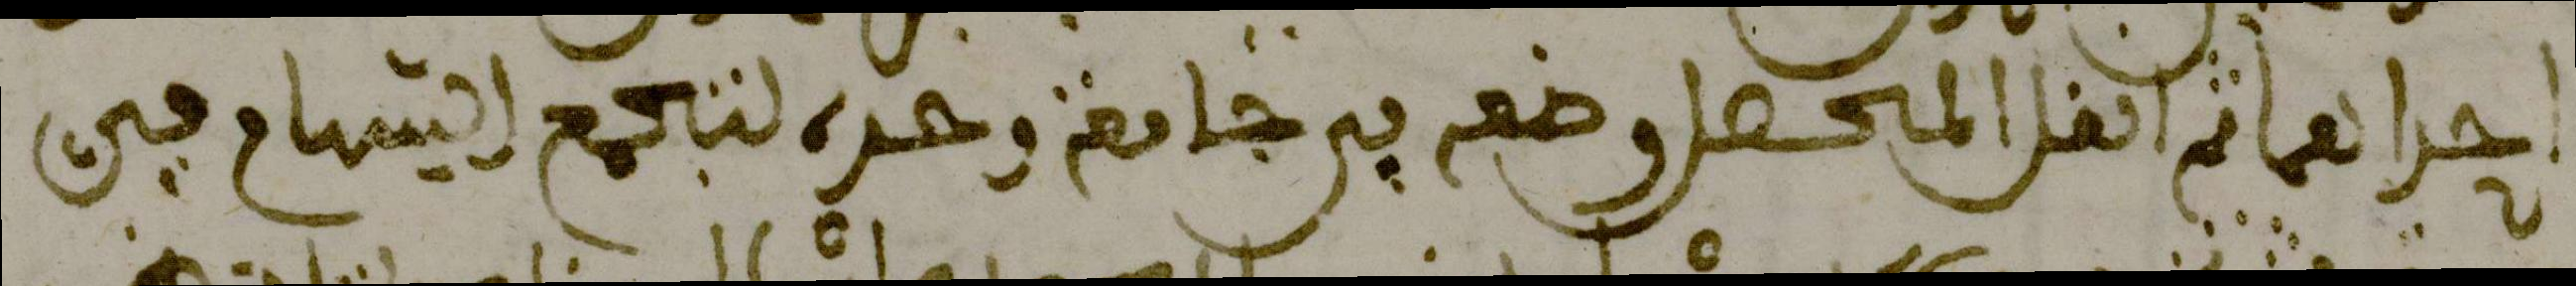احداهما ثم انقل المحصل وضعه في جامعة وحده لتجمع السِّهام في
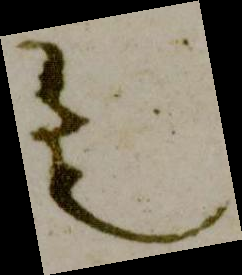سهم
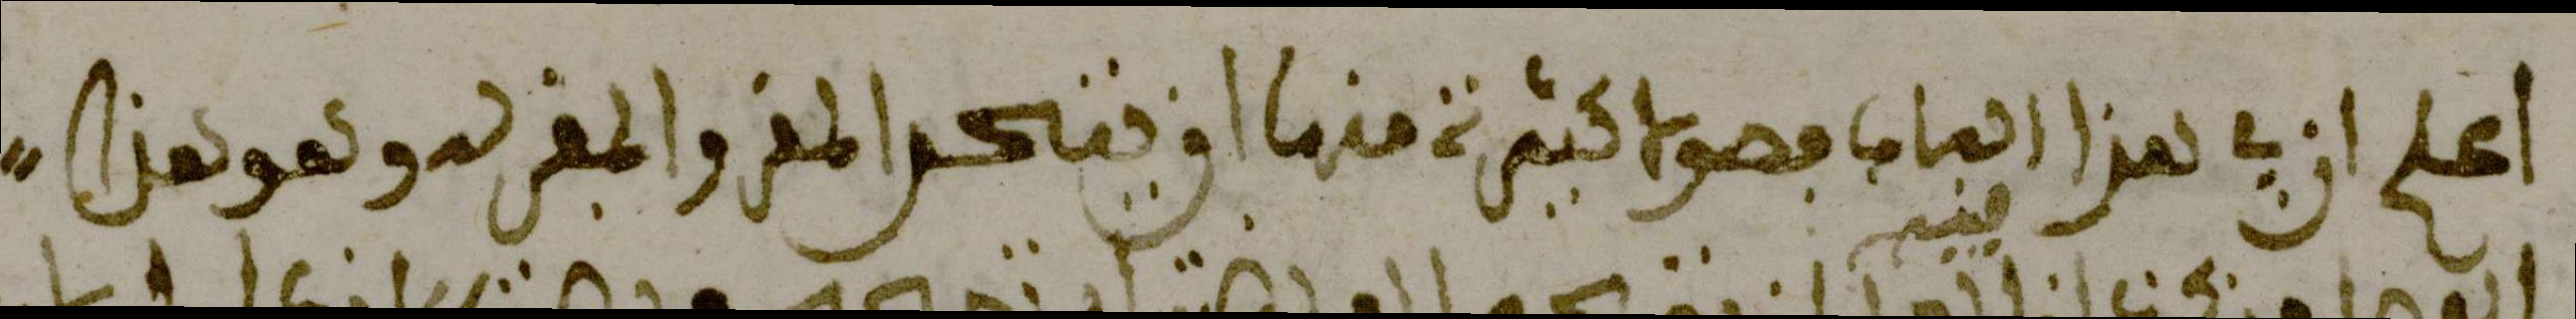اعلم ان في هذا الباب فصولا كثيرة منها ان يتحد المقر والمقر له وهو هذا
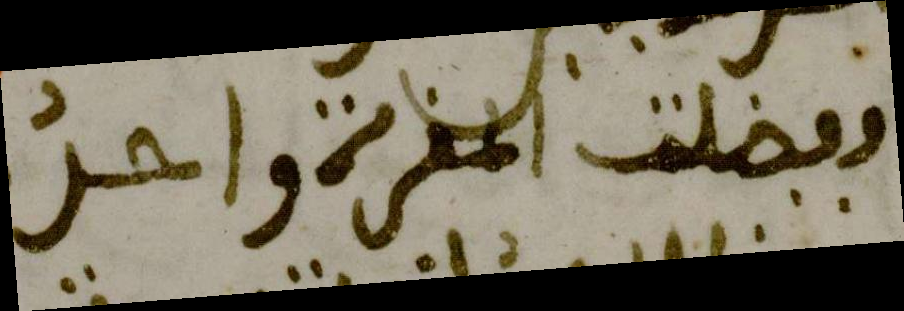ففضلت المقرة وواحد
